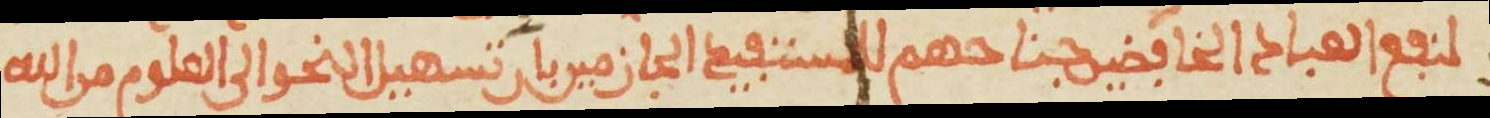لنفع العباد الخافضين جناحهم للمستفيد الجازمين بان تسهيل النحو الى العلوم من الله
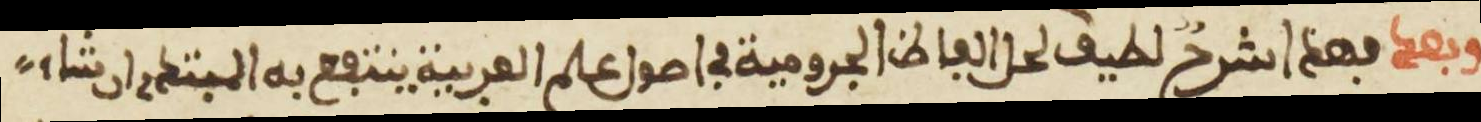و بعد فهذا شرح لطيف لحل الفاظ الجرومية في اصول علم العربية ينتفع به المبتدء ان شاء
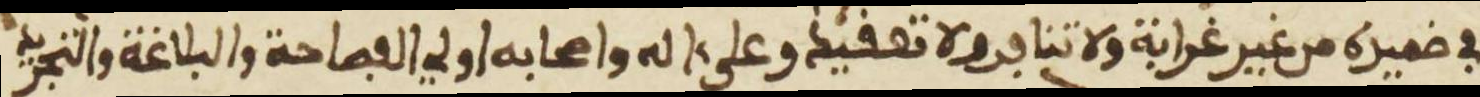في ضميره من غير غرابة ولا تنافر و لا تعقيد و على آله و اصحابه اولي الفصاحة و البلاغة و التجريد
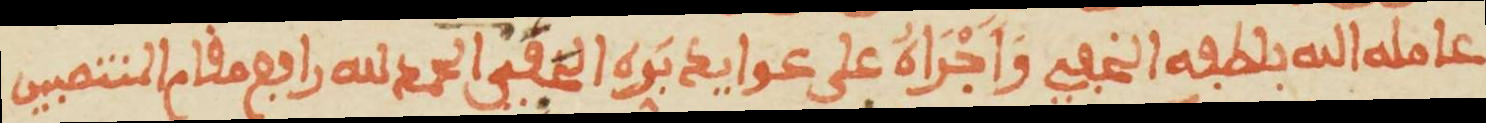عامله الله بلطفه الخفي و أجراه على عوايد بره الحفي الحمد لله راجع مقام المنتصبين
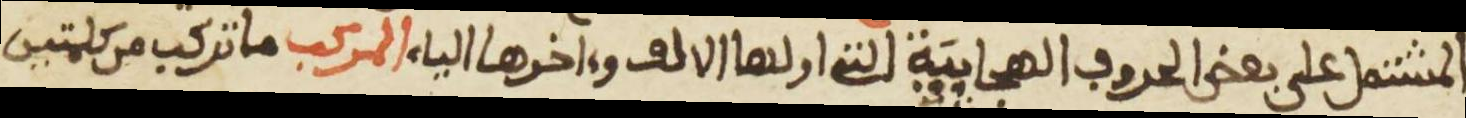المشتمل على بعض الحروف الهجائية التي اولها الالف و آخرها الياء المركب ما تركب من كلمتين
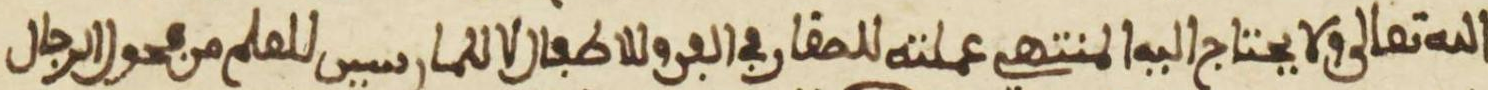الله تعالى و لا يحتاج اله المنتهي عملته للصغار في الفن و الاطفال لا للممارسين للعلم من فحول الرجال
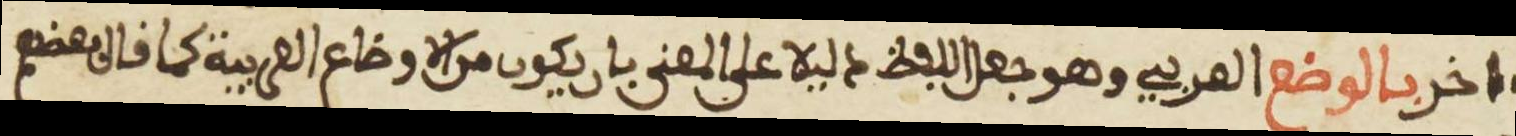اخر بالوضع العربي و هو جعل اللفظ دليلا على المعنى بان يكون من الاوضاع العربية كما قال بعضهم
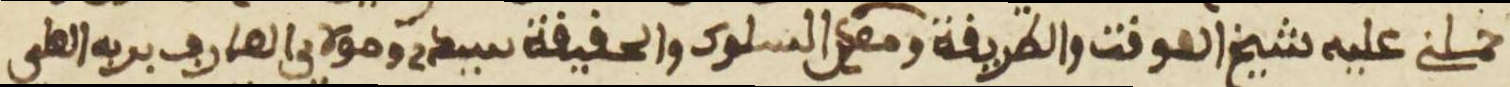و حملني عليه شيخ الوقت و الطريقة و معدن السلوك و الحقيقة سيدى و مولاي العارف بربه العلي
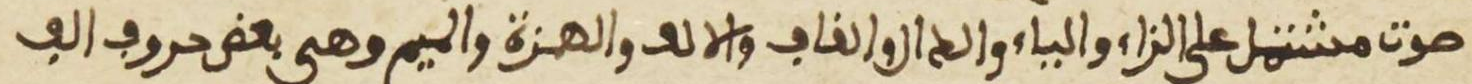صوت مشتمل على الزاء و الياء و الدال و القاف و الالف و الهمزة و الميم و هي بعض حروف الف
